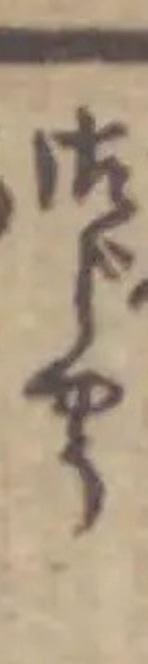御じやう
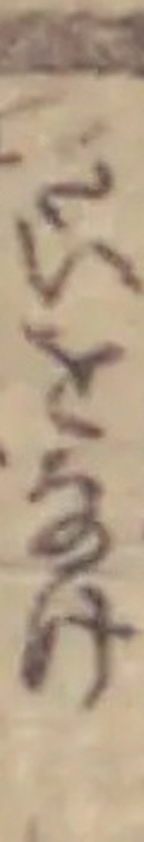さいをなけ
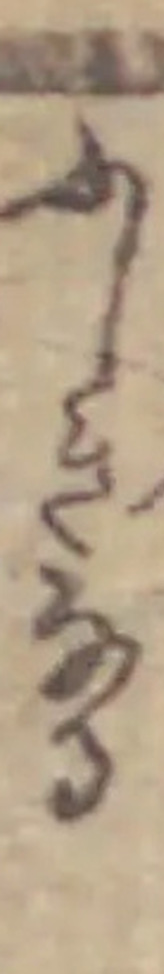ふしきなる
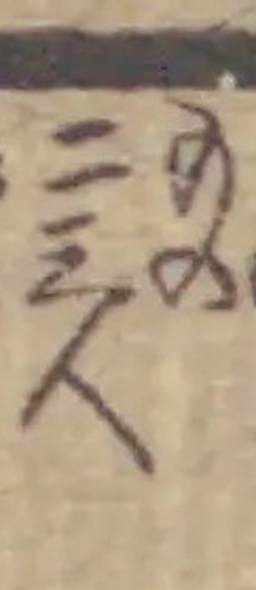二三人

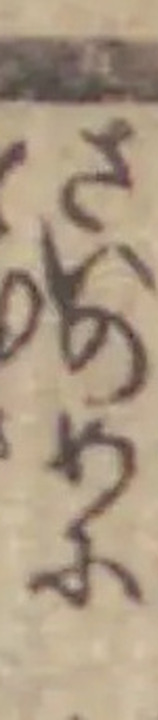さいのめに
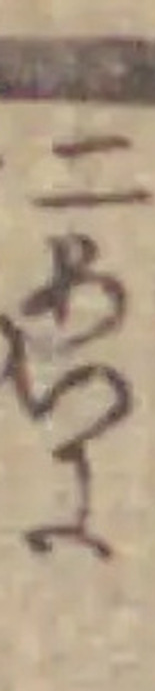二めいに
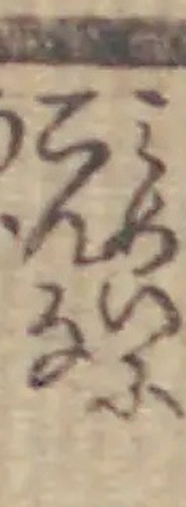こんな
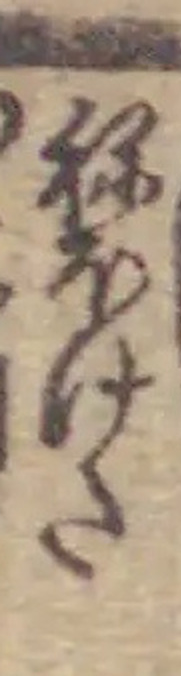ねほけた

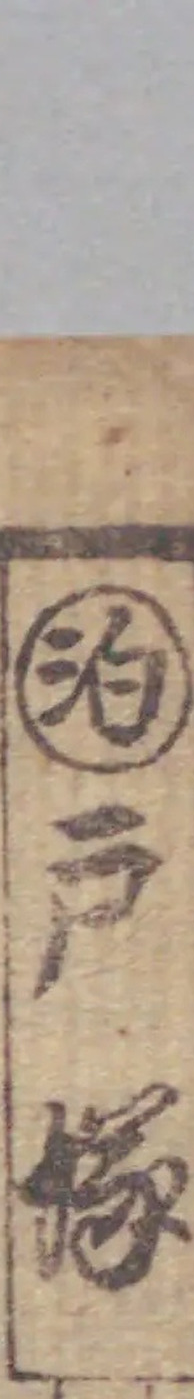(泊)戸塚
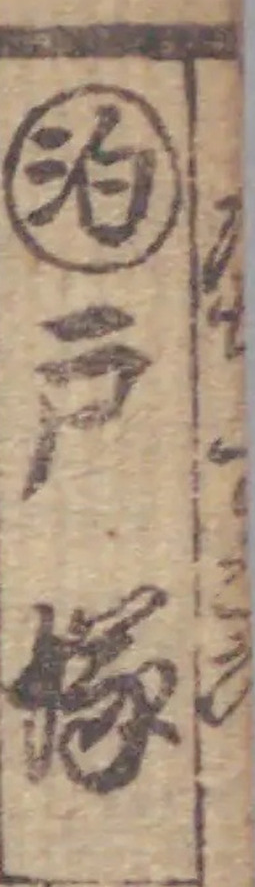(泊)戸塚
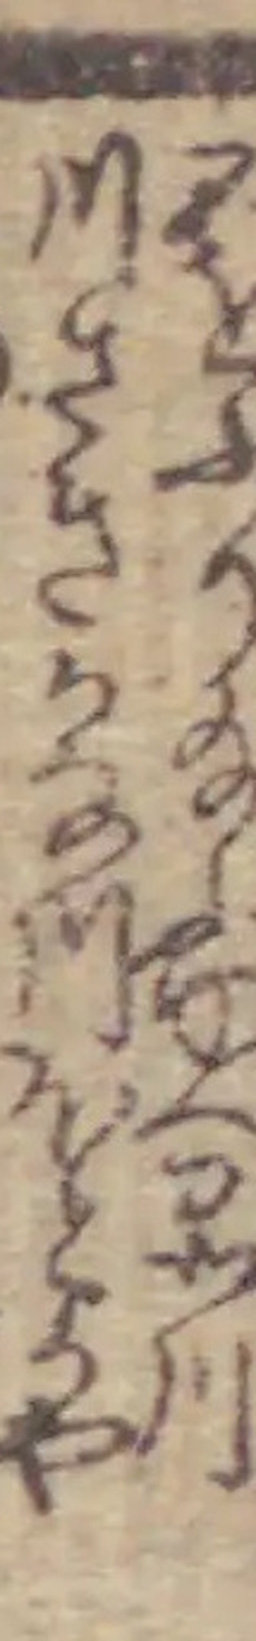川さきかな川ほとかや
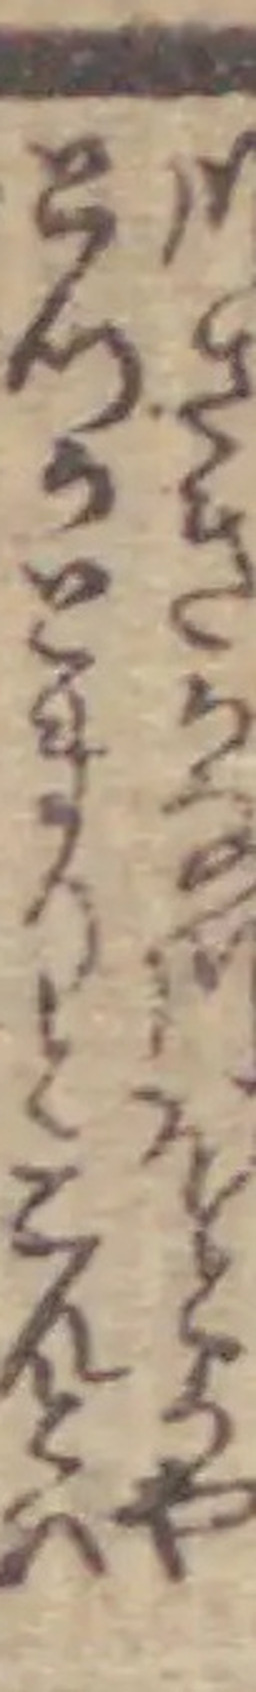とつかとまりとこんとは
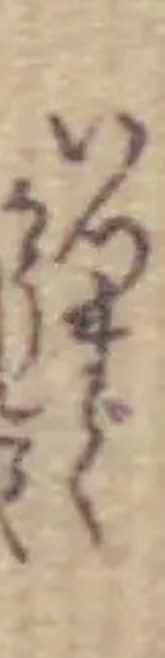いつまで
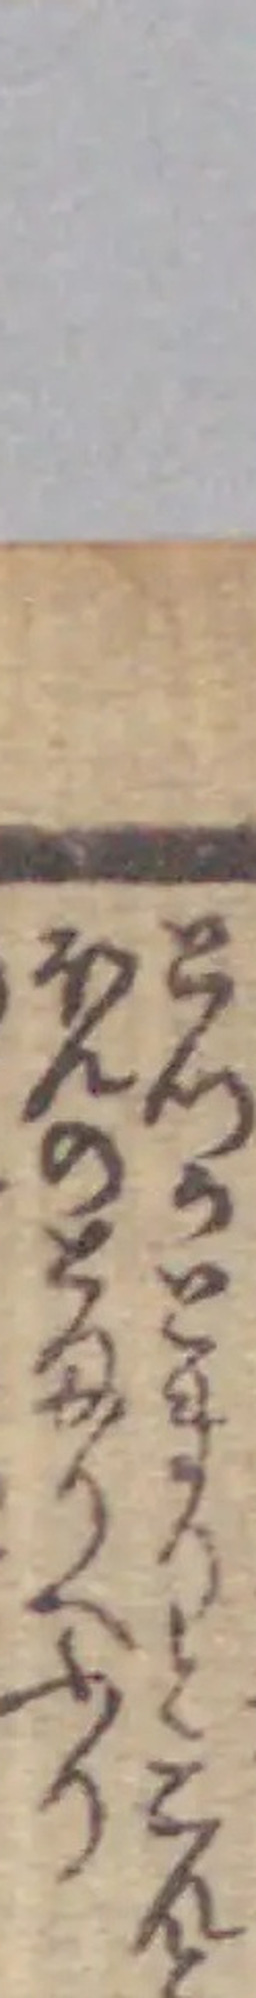ほんのとまりへふり
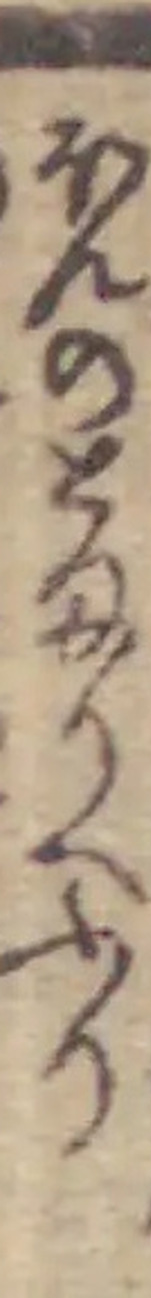ほんのとまりへふり
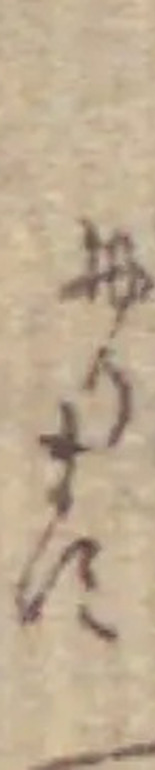おります
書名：道笑双六
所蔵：国立国会図書館 National Diet Library, JAPAN
